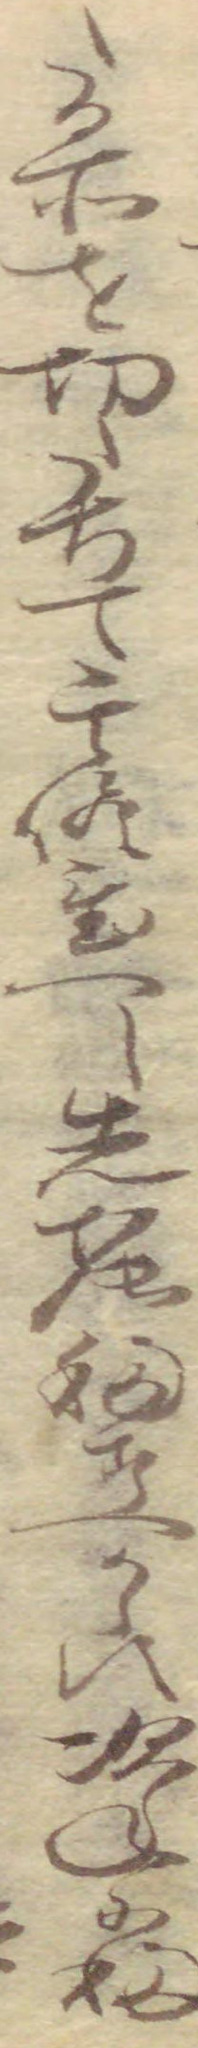たる所を切たちて其儘置へし先堀移すへからす次年に移
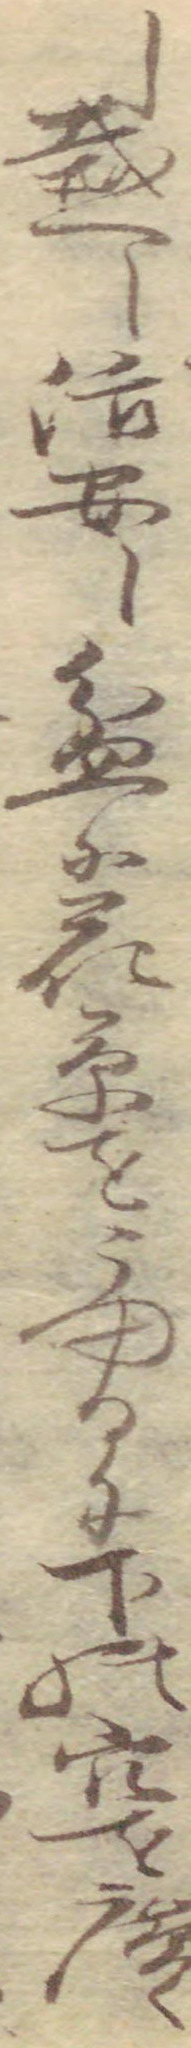し栽へし活安し盆に花草をうゆるに下の穴を広く
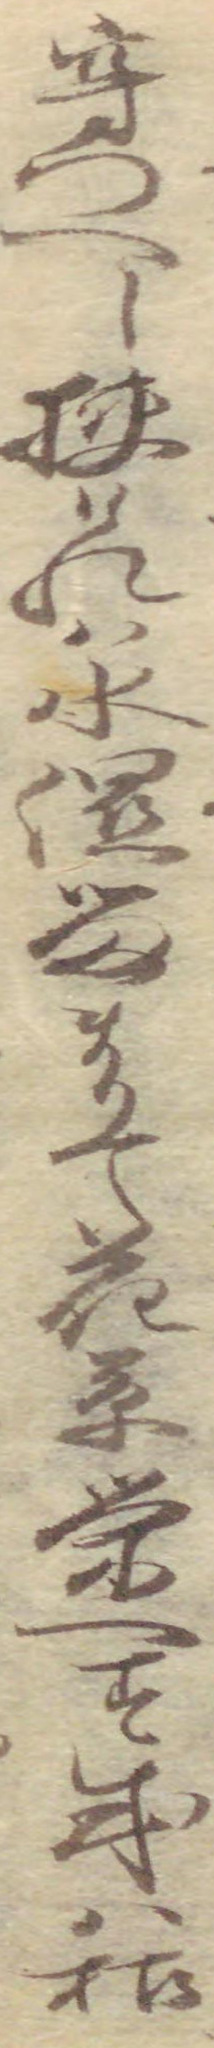穿つへし狭けれハ水湿留まりて花草栄へす或は枯
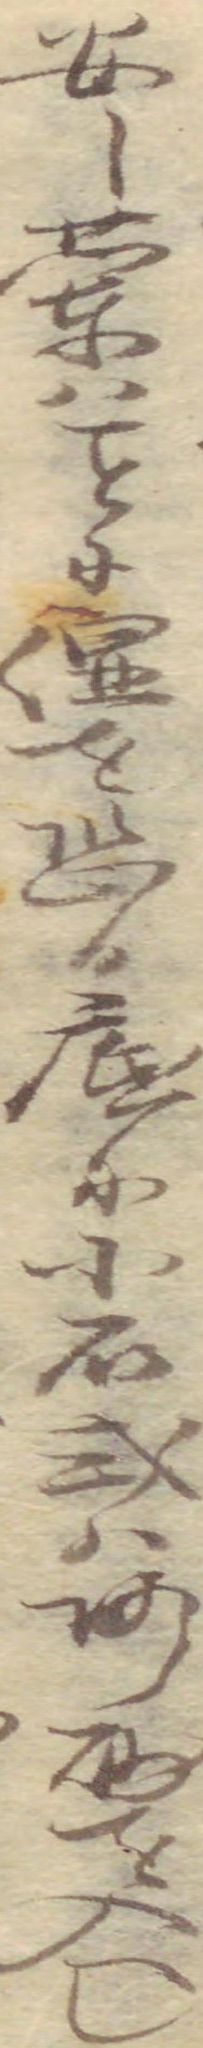安し蘭ハことに湿を恐る底に小石或ハ河ノ砂を入へし
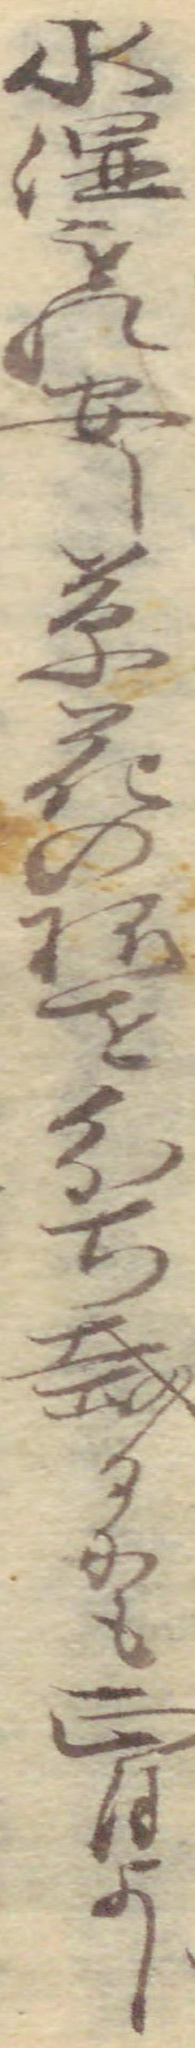水湿もれ安し草花の根を分ち栽るにも正月よし
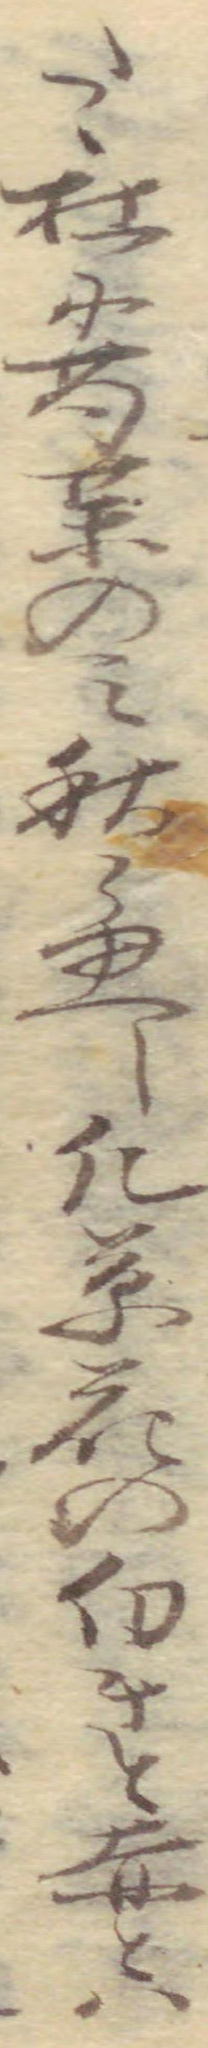たゝ牡丹芍薬のミ秋うゆへし凡草花の白きと赤とハ
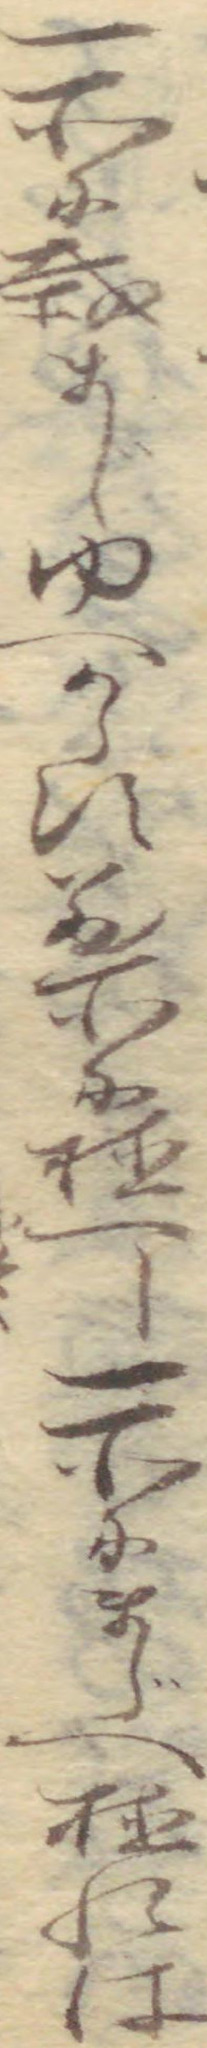一所に栽まじゆへからす別所に植へし一所にまじへ植れは
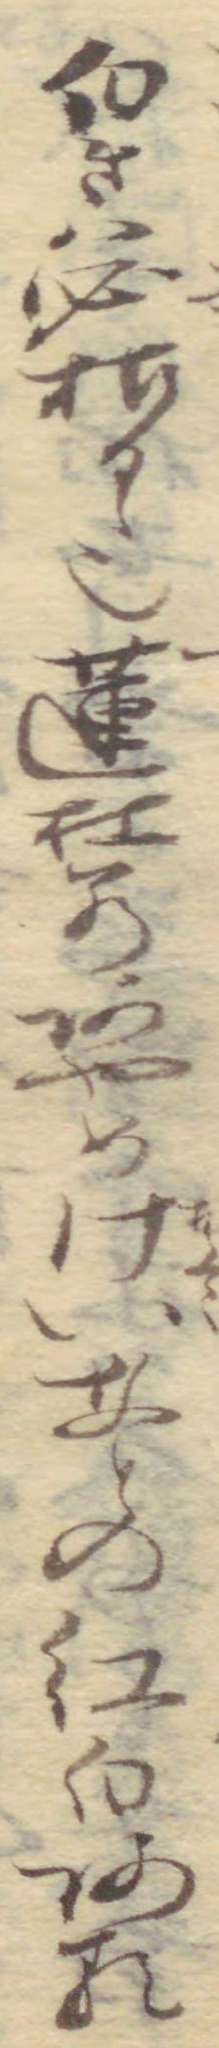白きハ必枯るゝ也蓮杜若あやめけいなとの紅白ある
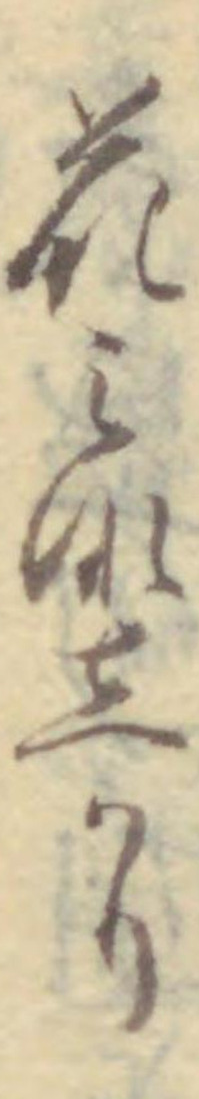花ミなしかり
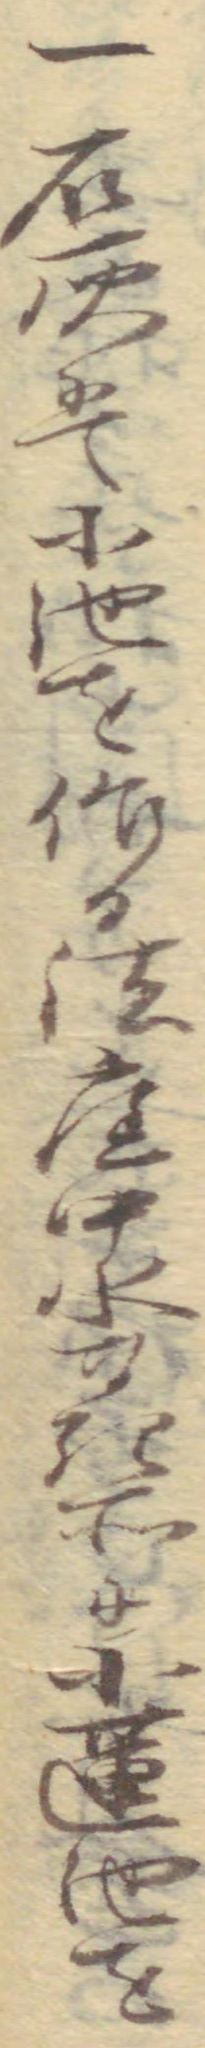一石灰にて小池を作る法庭中水なき所に小蓮池を
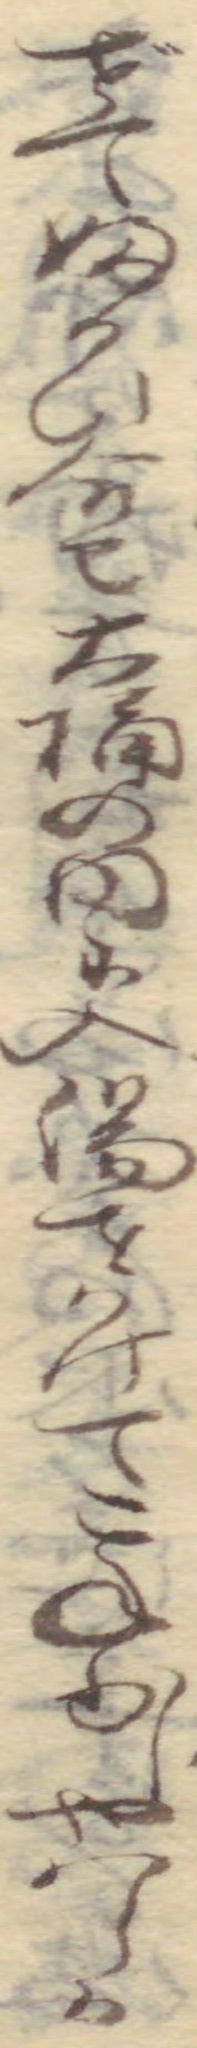ぜてふるひ合せ大桶の内に入湯をかけてこね少しやハらか
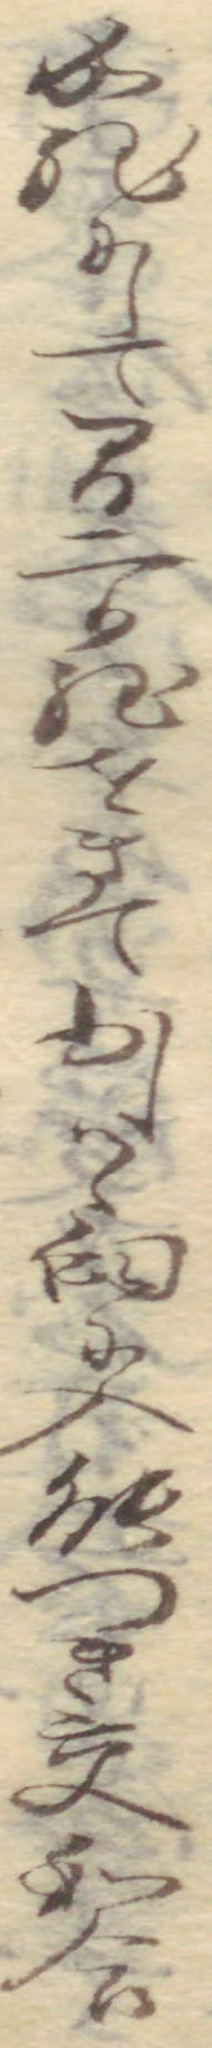成程にして間二日程をきて少しヅヽ臼に入能つき交和合
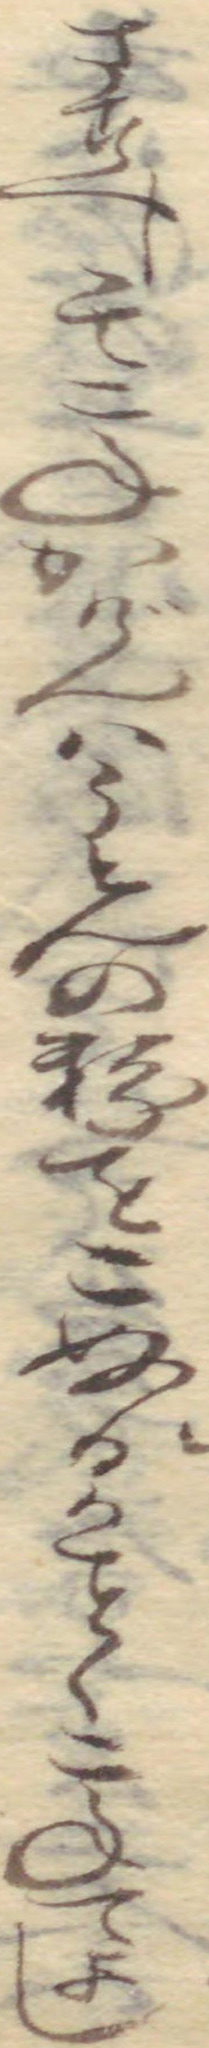さすへし其こねかげんハうとんの粉をこぬるかことくこねてよし
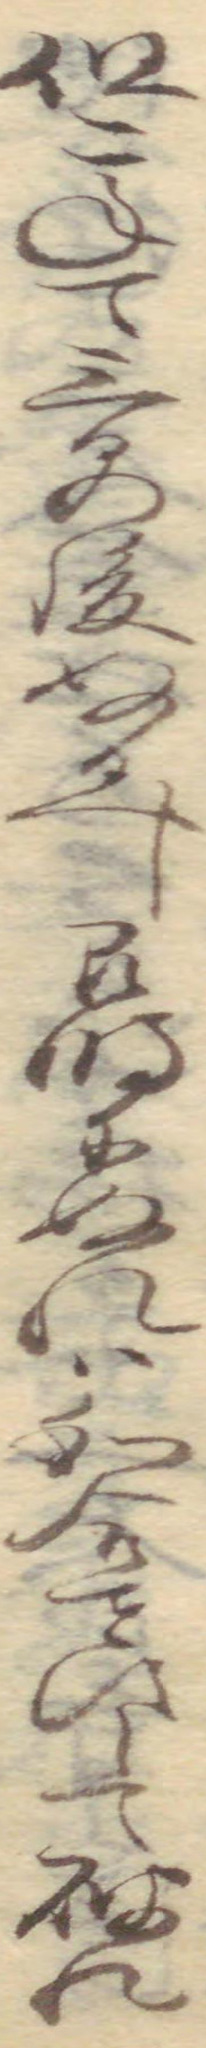但こねて三日の後ぬるへし即時にぬれハ和合せすして破れ
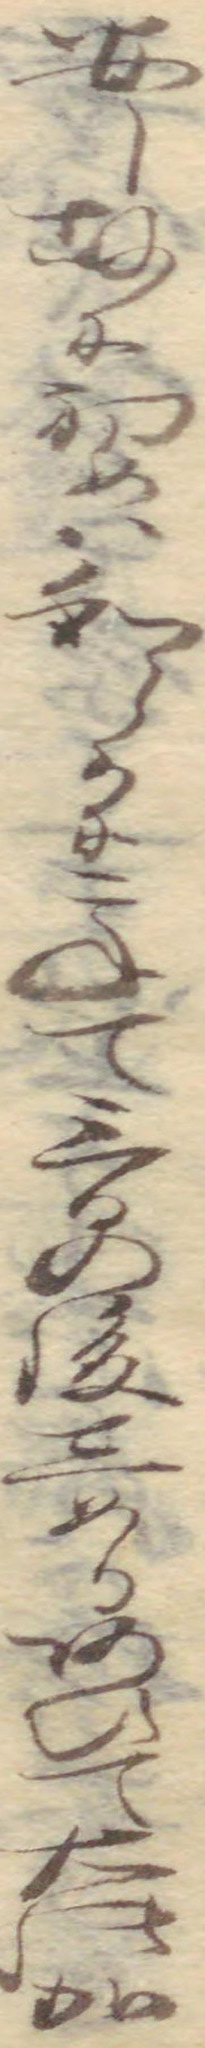安し故に初めハ和らかにこねて三日の後しめりあひて右の加
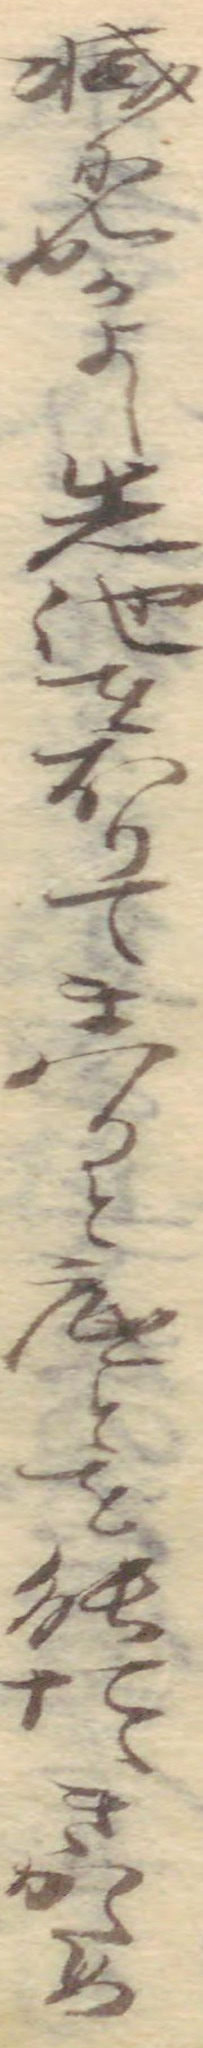減に成かよし先池をほりてまハりと底とを能たゝきかため
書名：鶯宿雑記. 巻199-200
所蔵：国立国会図書館 National Diet Library, JAPAN
